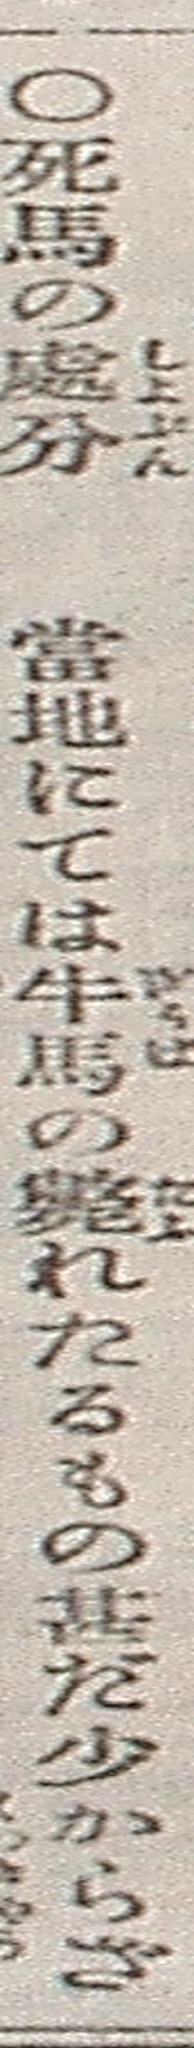〇死馬の処分当地にては牛馬の斃れたるもの甚だ少からざ
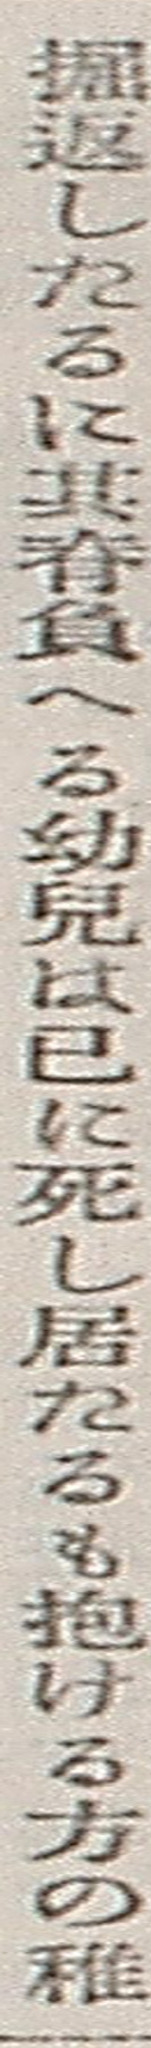掘返したるに其背負へる幼児は已に死し居たるも抱ける方の稚

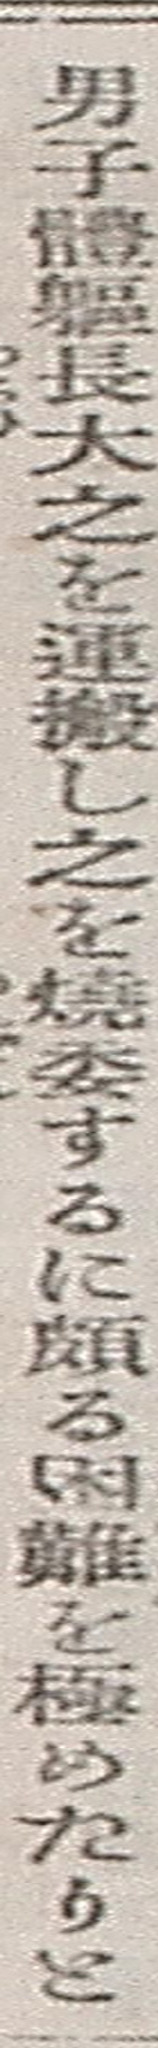男子体躯長大之を運搬し之を焼委するに頗る困難を極めたりと
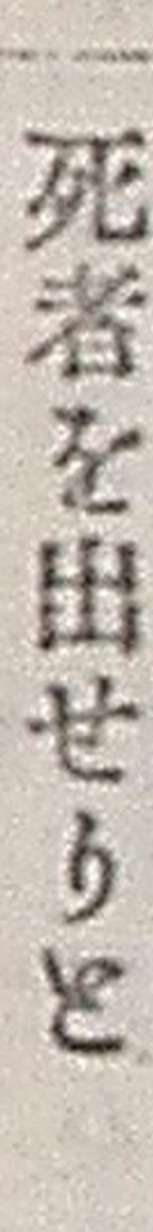死者を出せりと
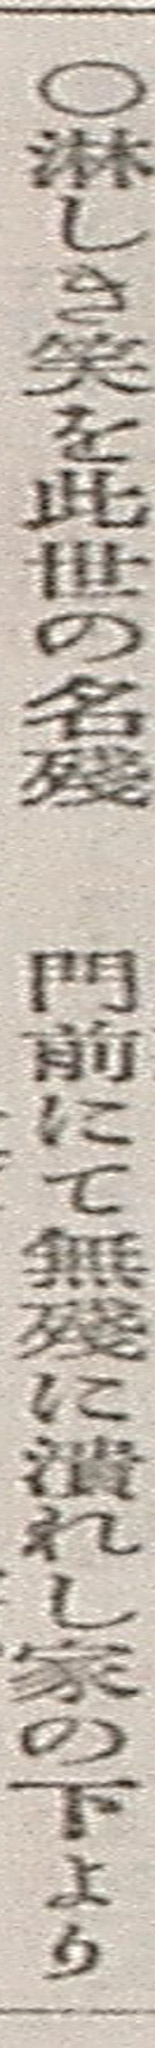〇淋しき笑を此世の名残門前にて無残に潰れし家の下より
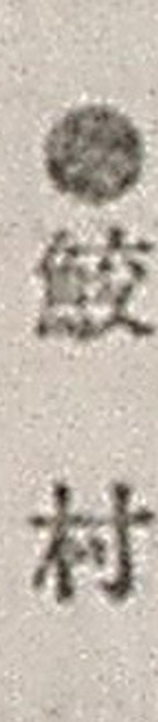●鮫村
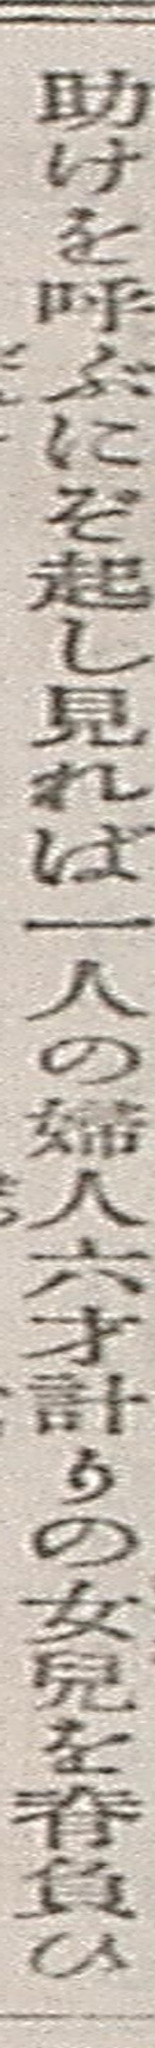助けを呼ぶのぞ起し見れば一人の婦人六才計りの女児を背負ひ
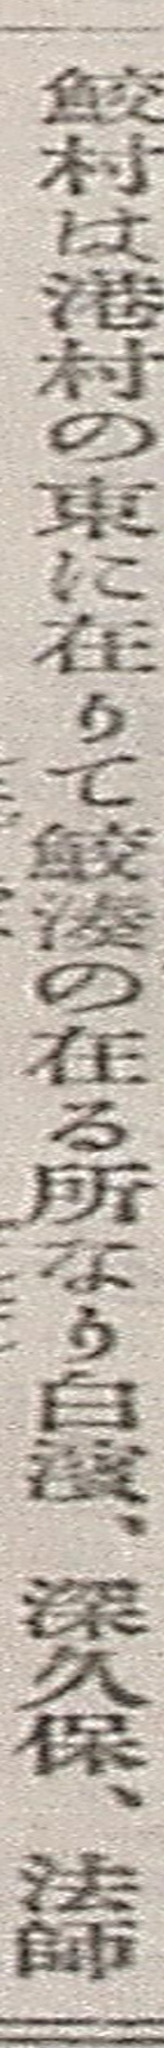鮫村は港村の東に在りて鮫湊の在る所なり白濱、深久保、法師
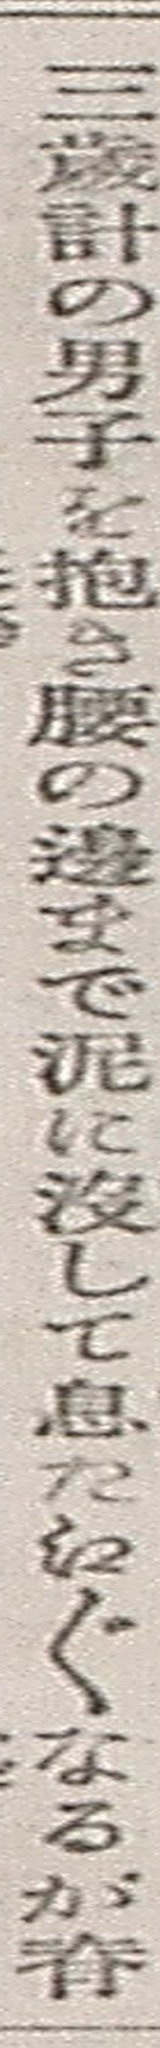三歳計の男子を抱き腰の辺まで泥に没して息たえ〴〵なるが背
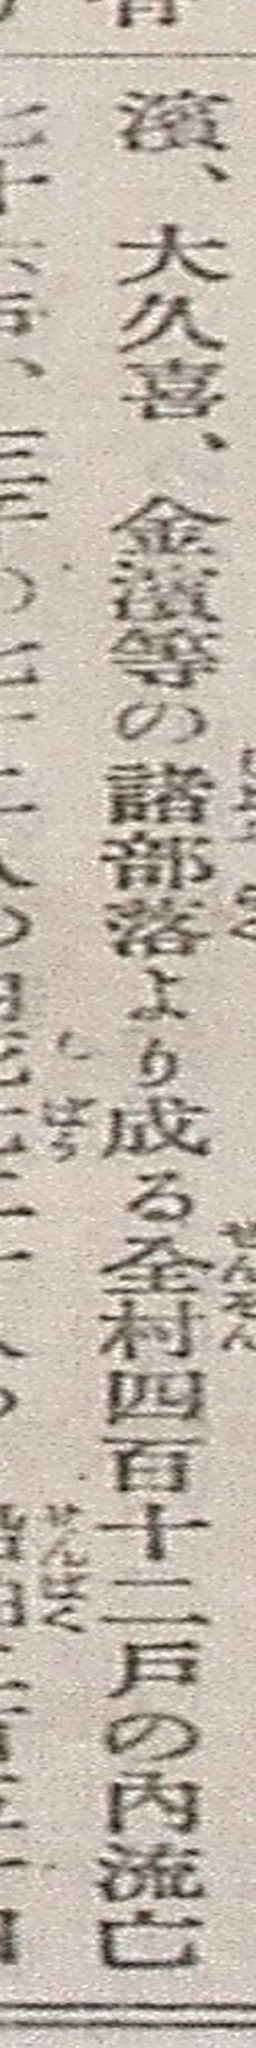濱、大久喜、金濱等の諸部落より成る全村四百十二戸の内流亡
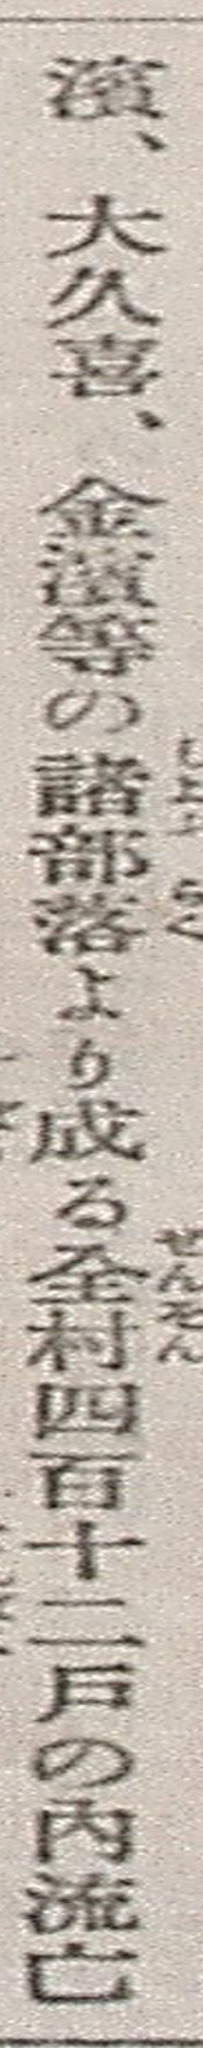濱、大久喜、金濱等の諸部落より成る全村四百十二戸の内流亡
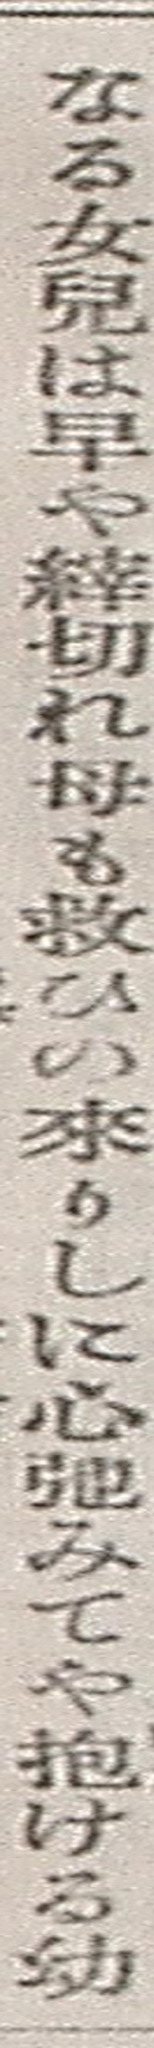なる女児は早や縡切れ母も救ひの来りしに心弛みてや抱ける幼
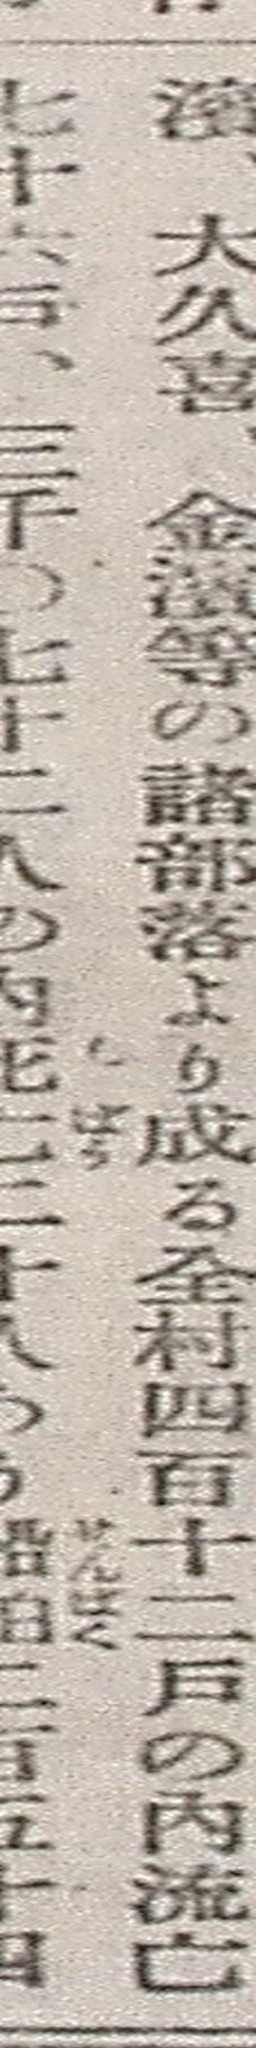七十六戸、三千〇七十二人の内死亡二十人あり船舶二百五十四
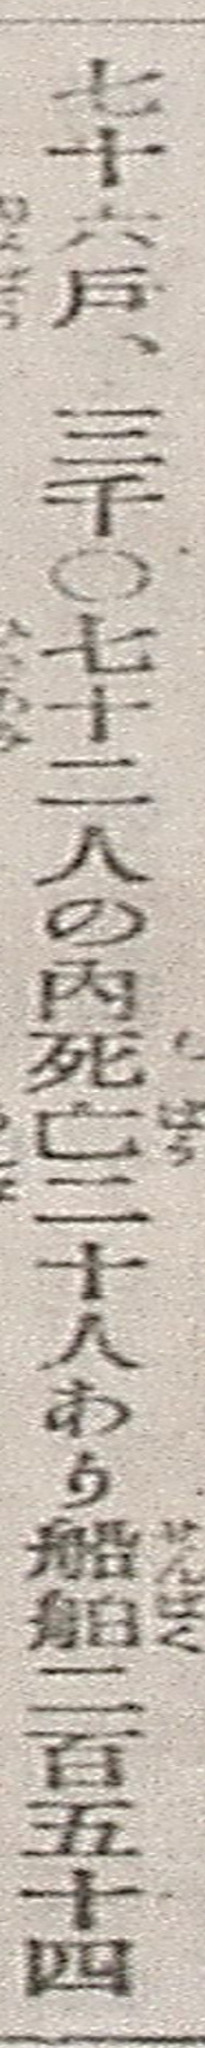七十六戸、三千〇七十二人の内死亡二十人あり船舶二百五十四
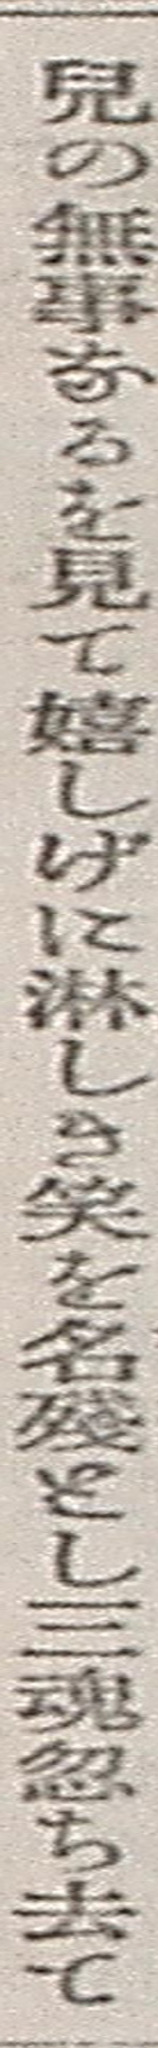児の無事なるを見て嬉しげに淋しき笑を名残とし三魂忽ち去て
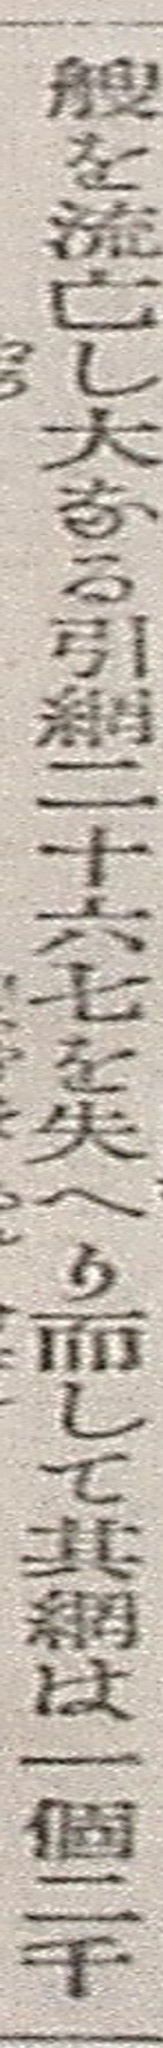艘を流亡し大なる引網二十六七を失へり而して其網は一個二千
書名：風俗畫報臨時増刊第百十九號　大海嘯被害録（中）
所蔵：東京大学地震研究所図書室 Earthquake Research Institute Library, The University of Tokyo, JAPAN
